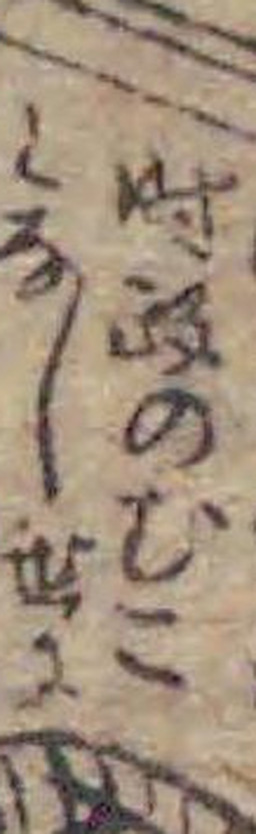となし世に
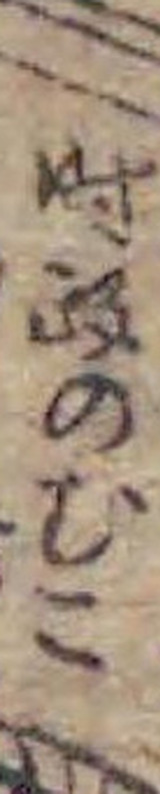時政のむこ
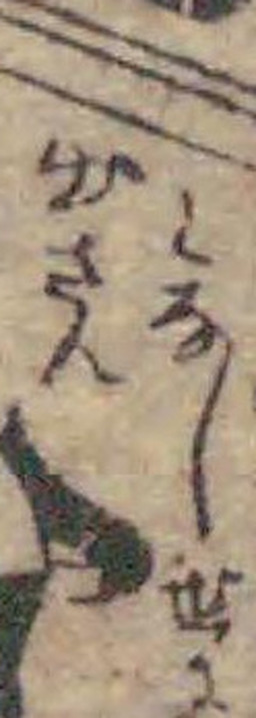出さん
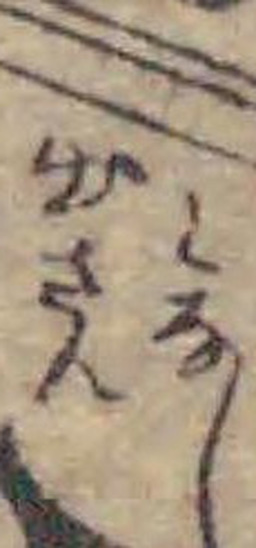出さん
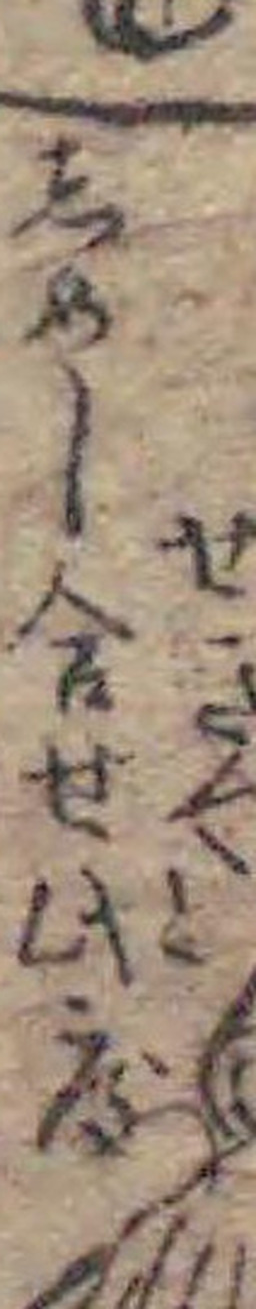しめし合せ此度
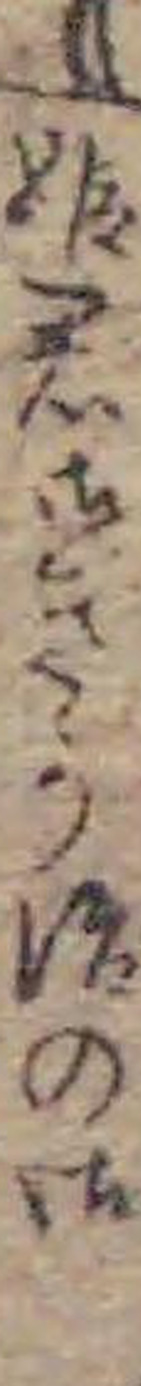姫君御きう治の御
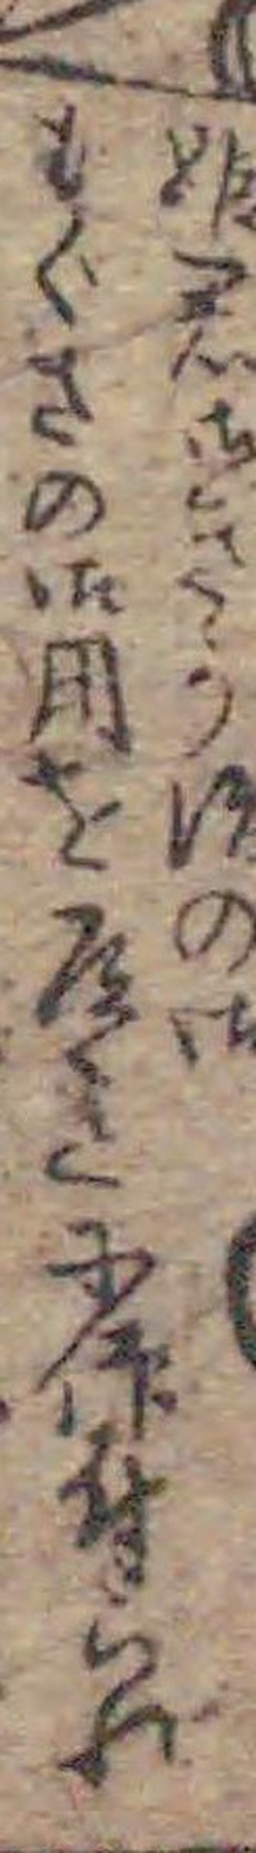もぐさの御用を道意に仰付られ
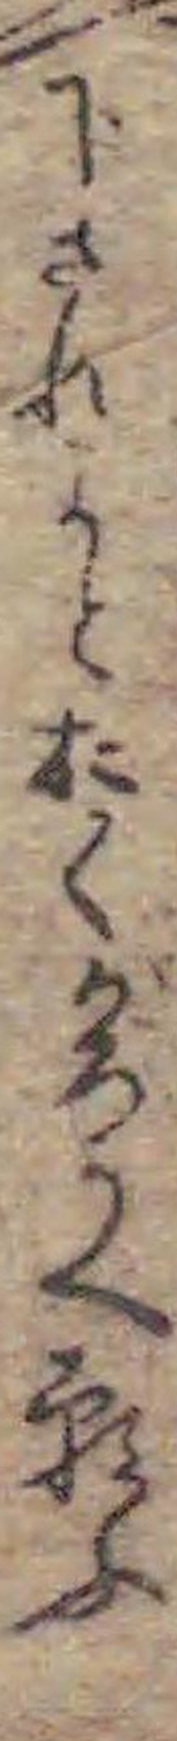下されよとおくがろうへ願ふ
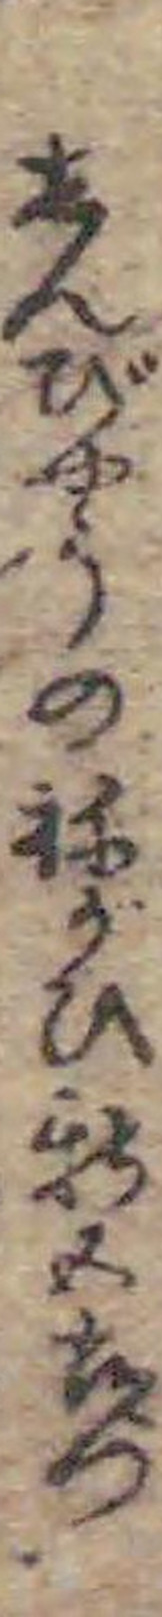しんびやうのねがひ新五左衛門
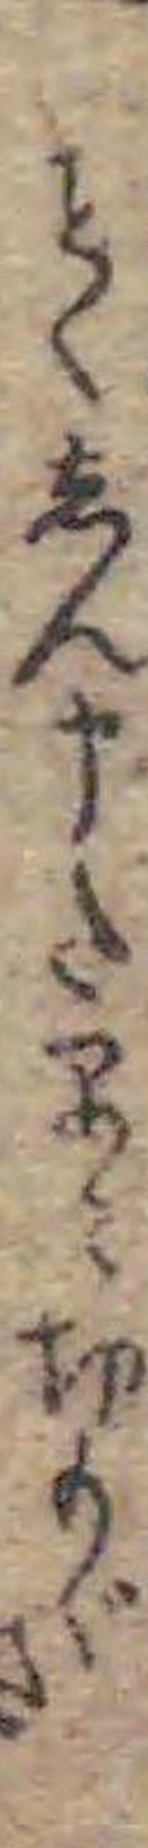とくしん申た早々切もぐさ
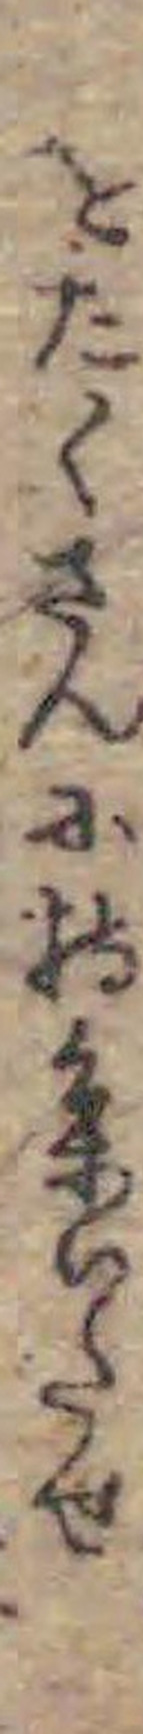をたくさんに持参いたせと
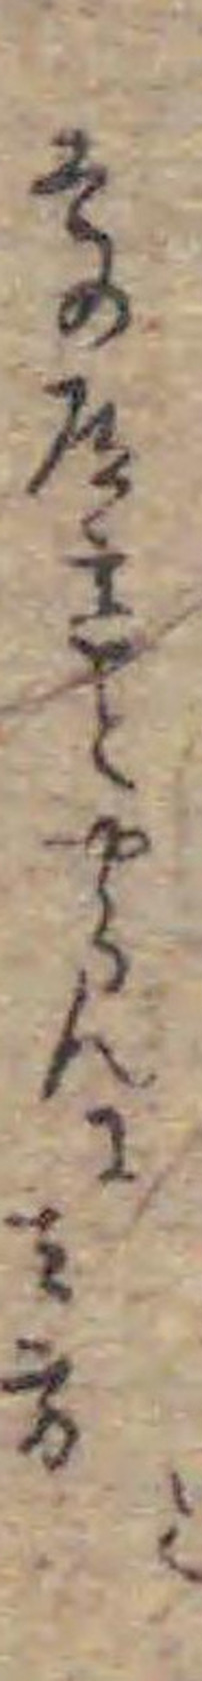その道意とやらんに其方
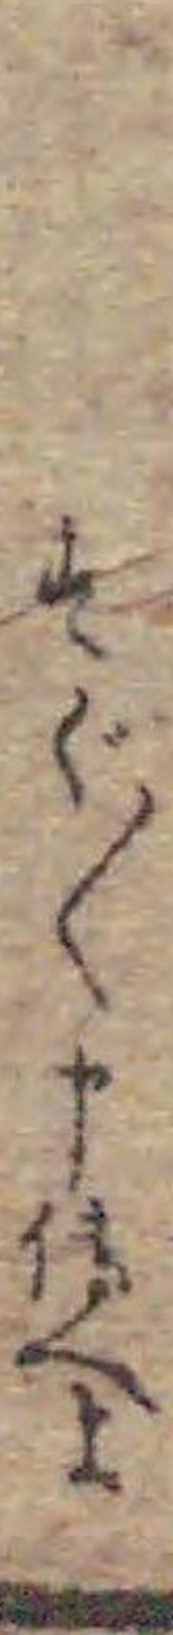すぐ〳〵申伝へよ
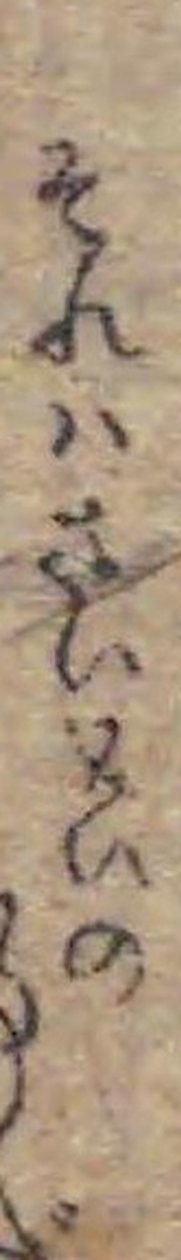それはさいわいの
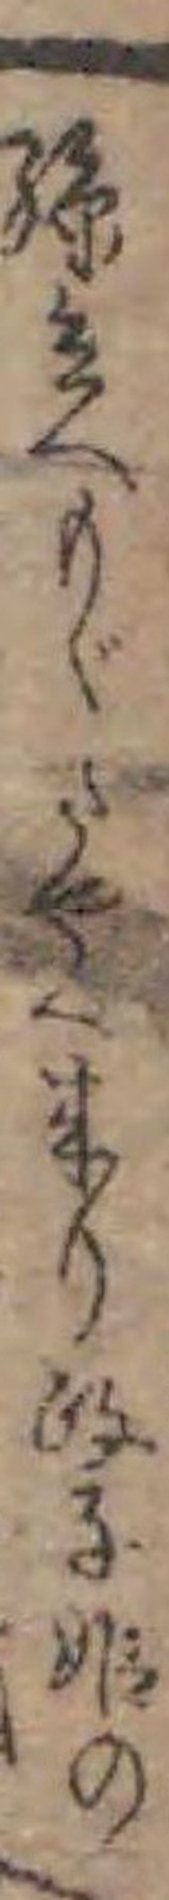孫兵へもぐさやへ来り政子姫の
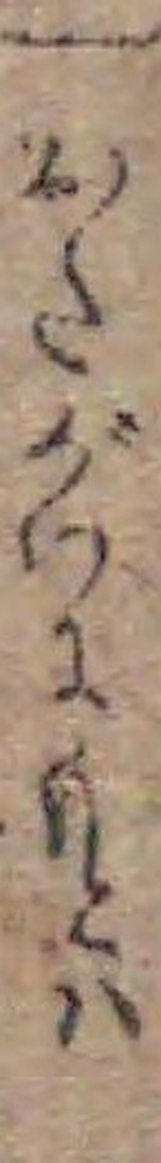おたがいにもとは
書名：三舛増鱗組 : 3巻
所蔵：国立国会図書館 National Diet Library, JAPAN
